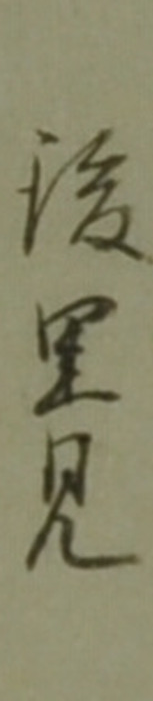後里見
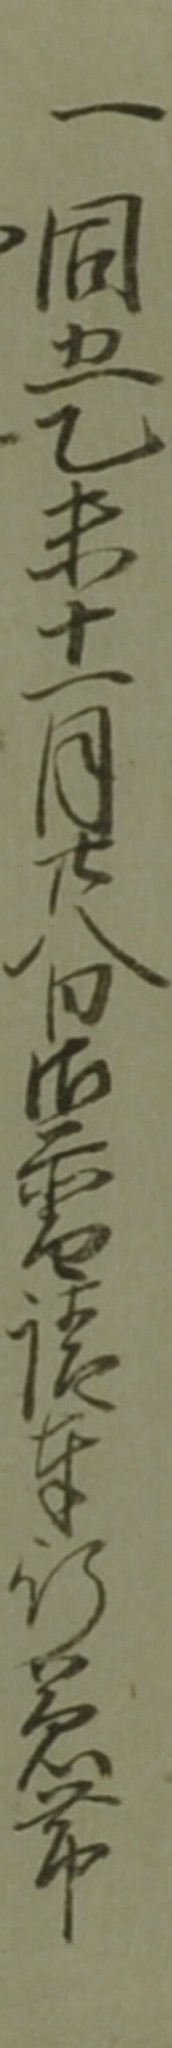一同五乙未十一月廿八日御普請奉行兼帯
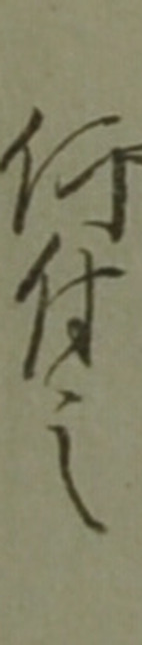仰付之
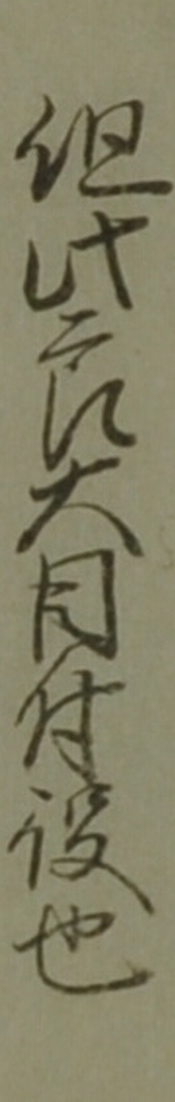但此節大目付役也
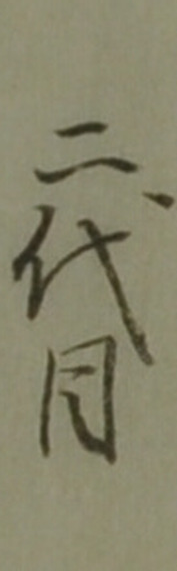二代目
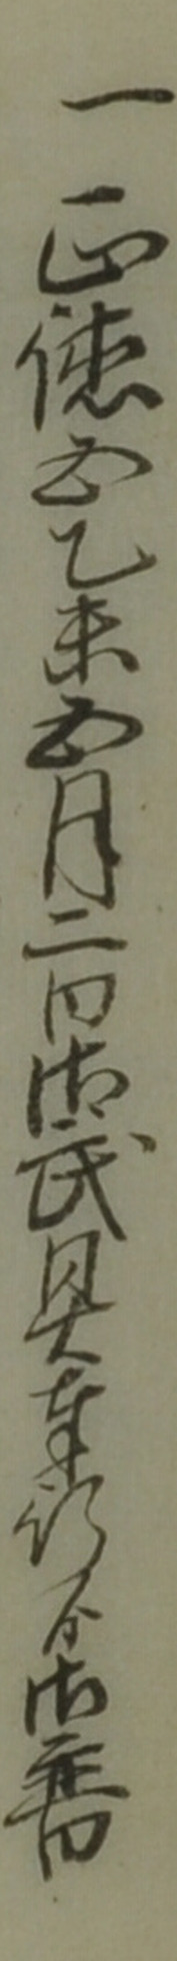一正徳五乙未五月二日御武具奉行ゟ御普
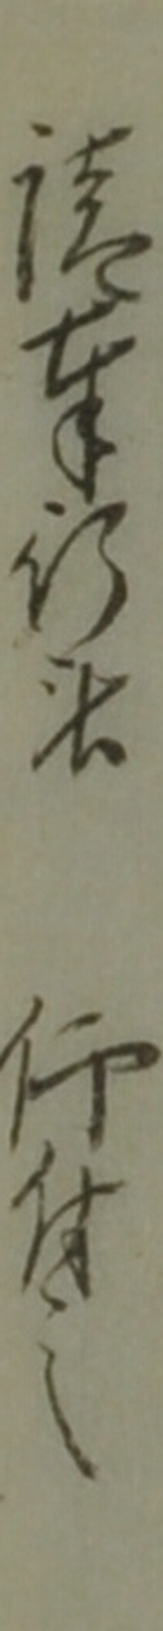請奉行被仰付之
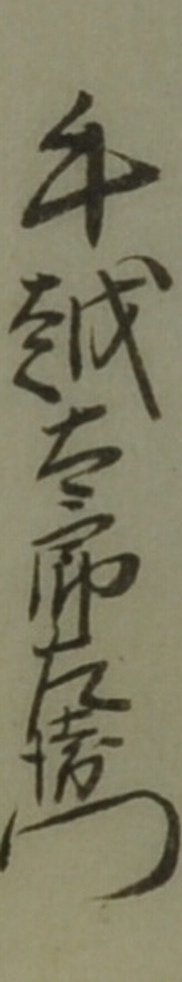手越太郎左衛門
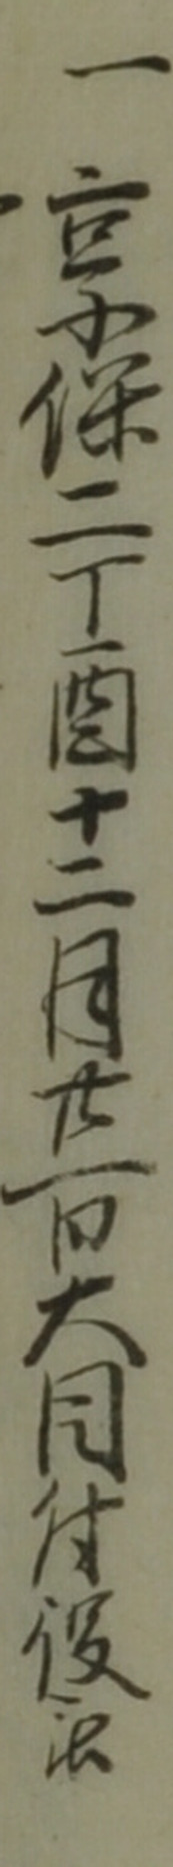一享保二丁酉十二月廿一日大目付役被
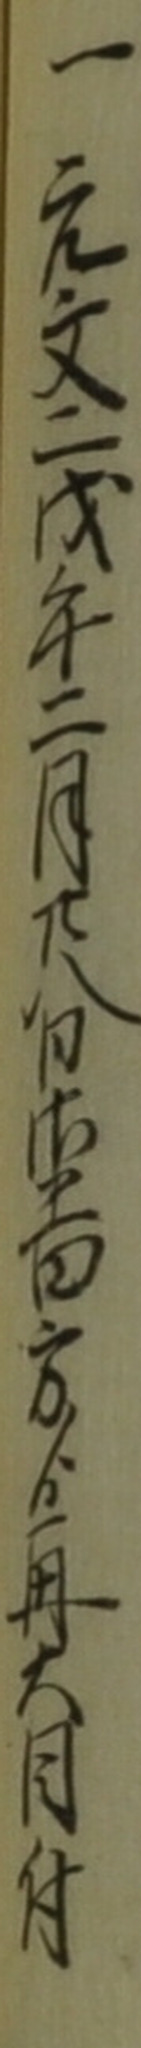一元文二戊午二月廿八日御番方ゟ再大目付
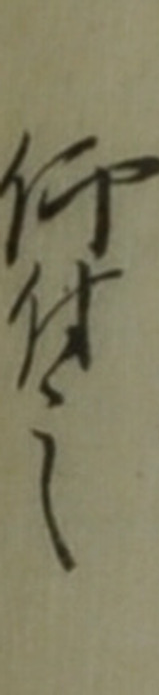仰付之
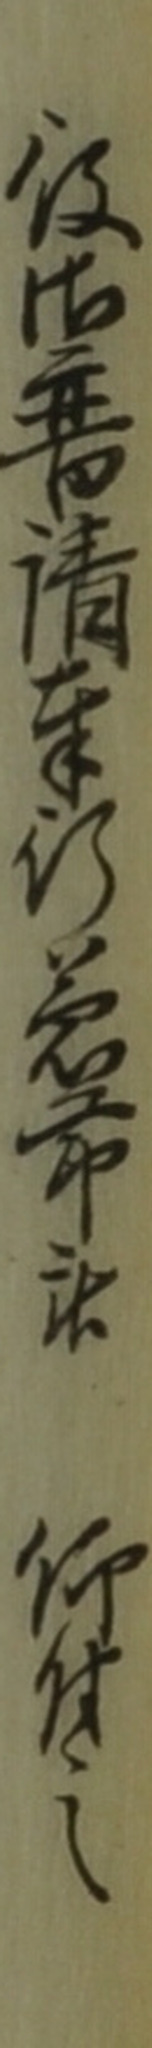役御普請奉行兼帯被仰付之
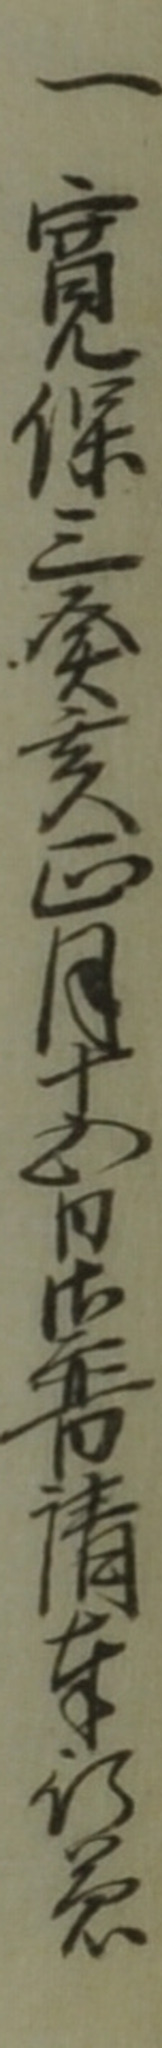一寛保三癸亥正月十五日御普請奉行兼
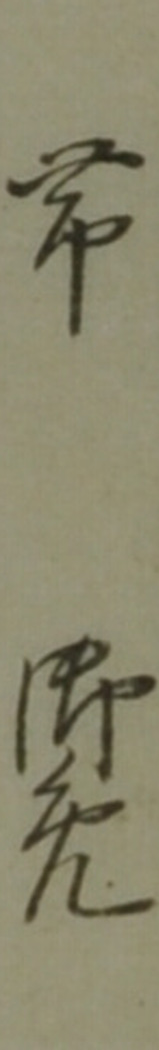帯御免
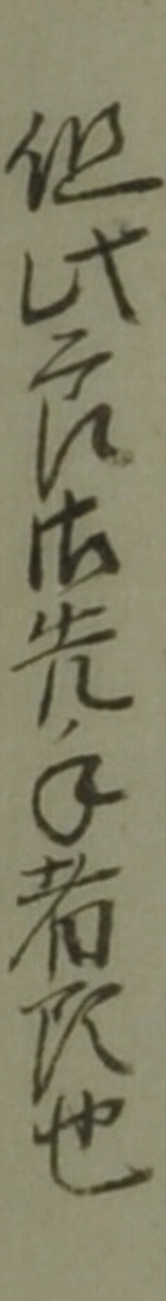但此節御先手者頭也
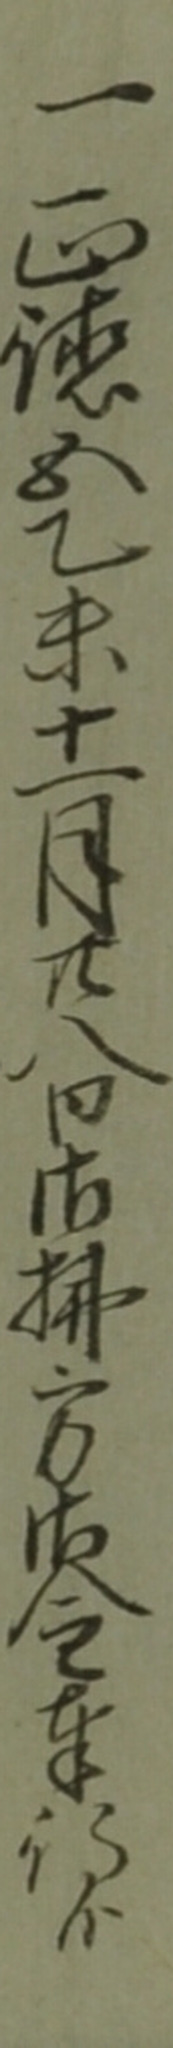一正徳五乙未十一月廿八日御払方御金奉行ゟ
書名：諸御役代々録（六）
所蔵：伊那市立高遠町図書館・合同会社AMANE
